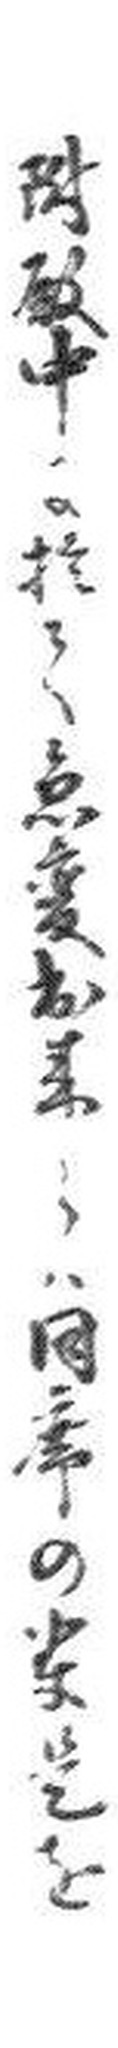附殿中に於て急変出来らは同席の輩是を
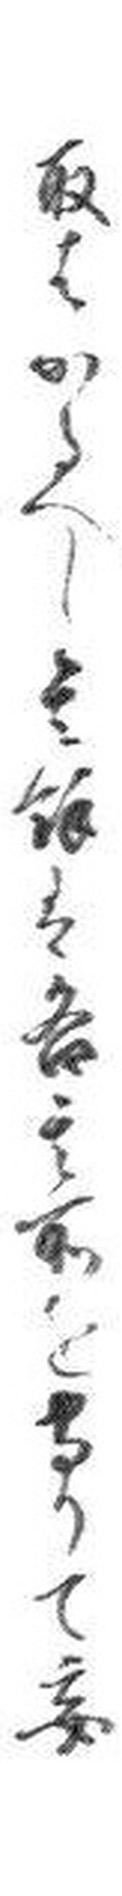取はかるへし其余は各其所を守りて妄
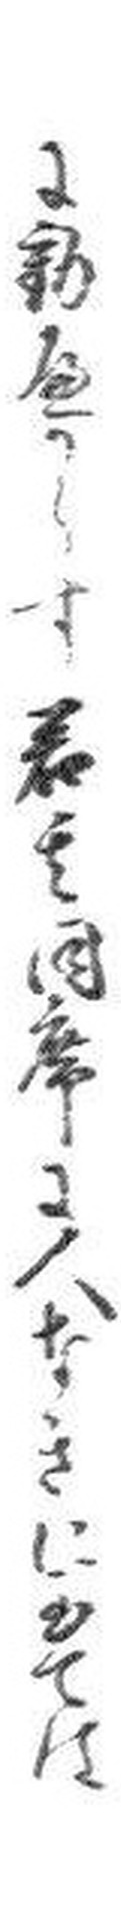に動へからす若其同席に人なきに至ては
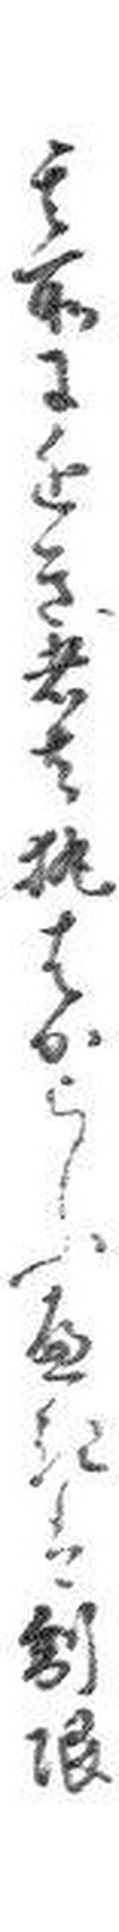其所に近き者共執はからふへきは制限
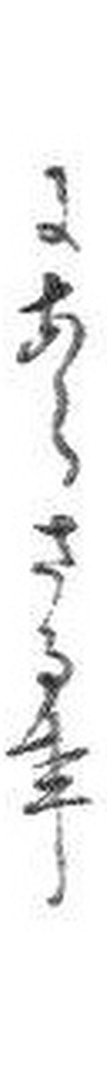にあらさる事
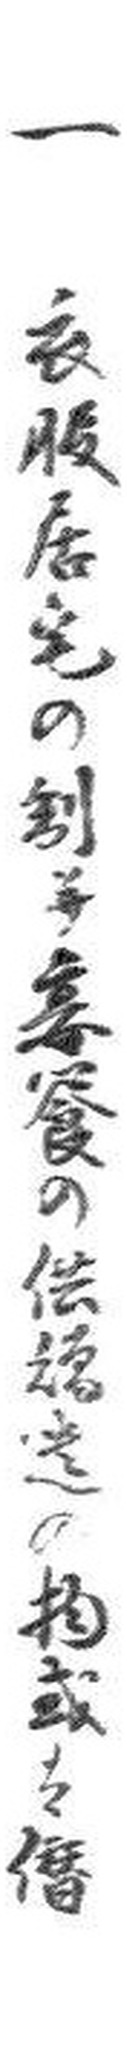一衣服居宅の制幷宴饗の供贈遺の物或は僭
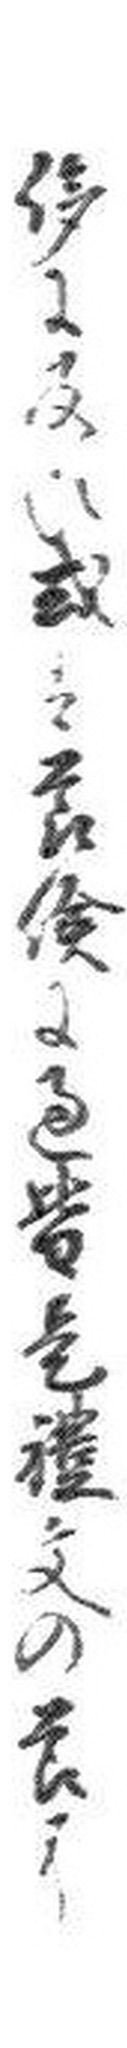侈に及ひ或は節倹に過皆是礼文の節に
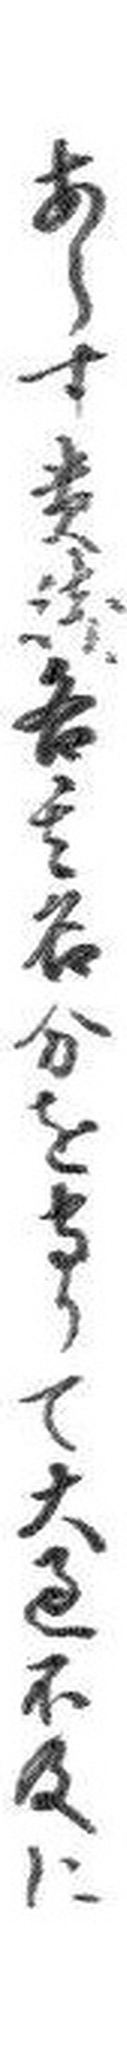あらす貴賤各其名分を守りて大過不及に
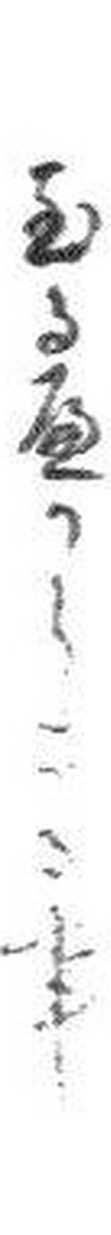至るへからさる事

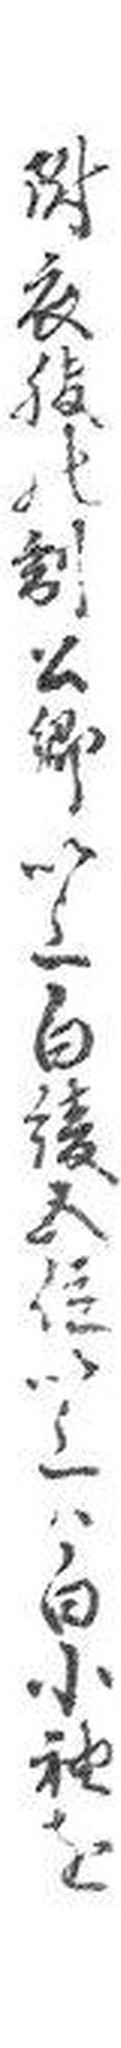附衣服の制公卿以上白綾五位以上は白小袖を
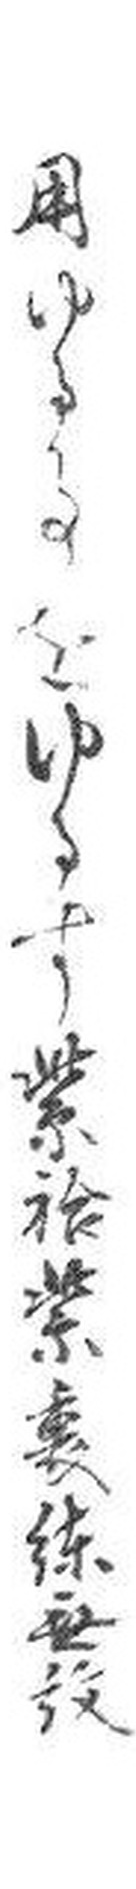用ゆる事をゆるす紫袷紫裏練無紋
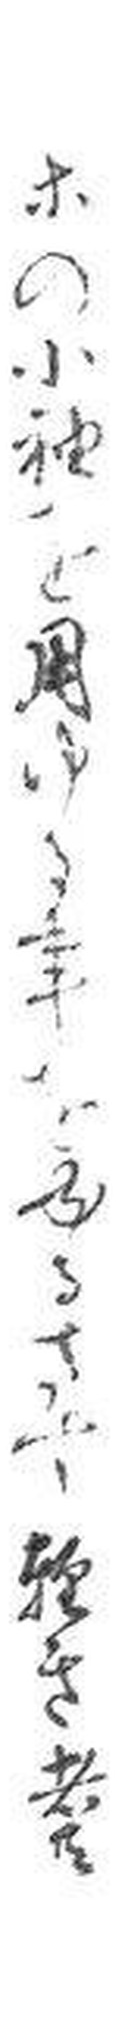等の小袖を用ゆる事をゆるさす軽き者共
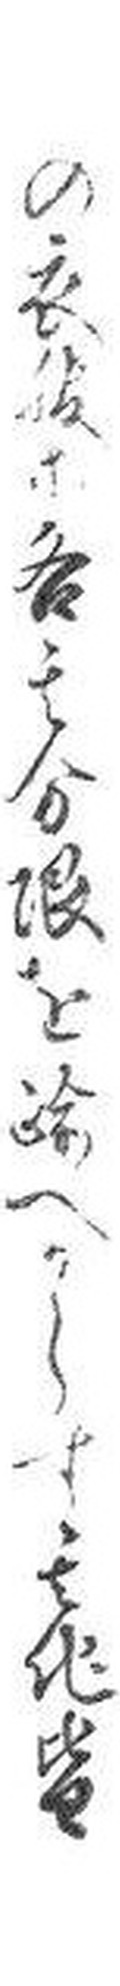の衣服等各其分限を踰へからす其他皆
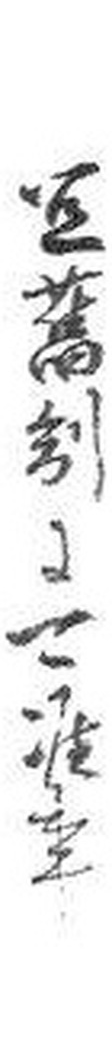宜旧制に可准事
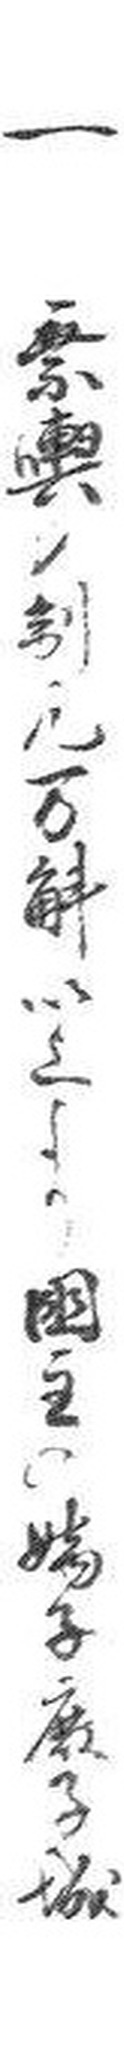一乗輿の制凡万斛以上より国主の嫡子庶子城
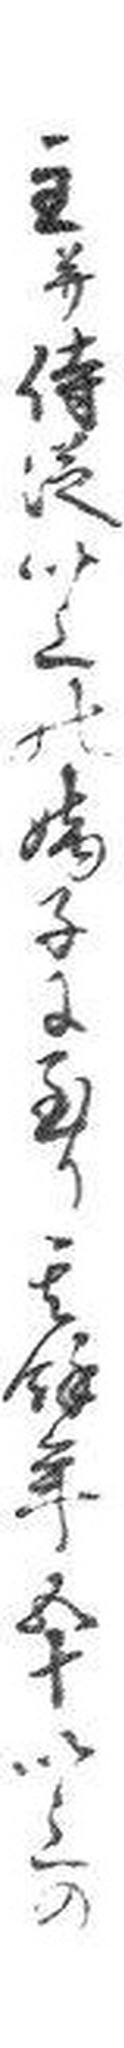主幷侍従以上の嫡子に至り其余年五十以上の
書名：家譜 二十五 吉品公 従宝永六年到同七年
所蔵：福井県文書館 Fukui Prefectural Archives
